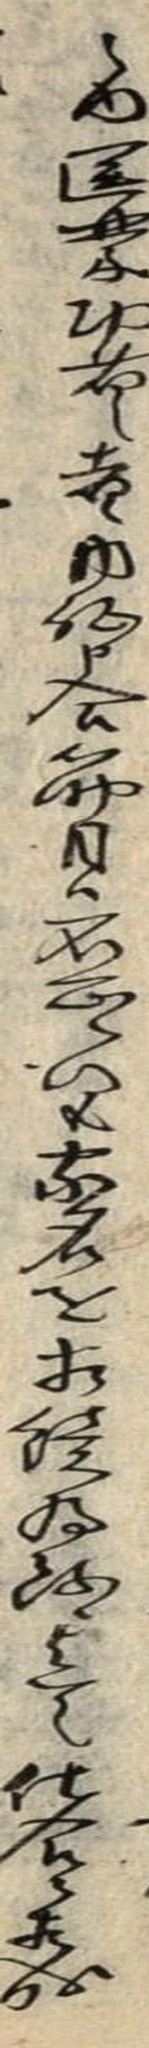之内医業巧者之者へ内証申合筋目は不正候得共家名を相続為致候迄之仕合に相成
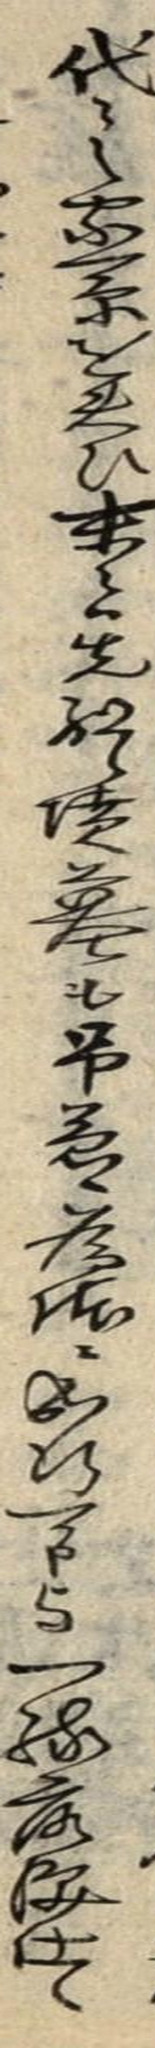代々之家系を失ひ未々ハ先祖之墳墓も吊兼候為体に成行可申と一統落涙仕候
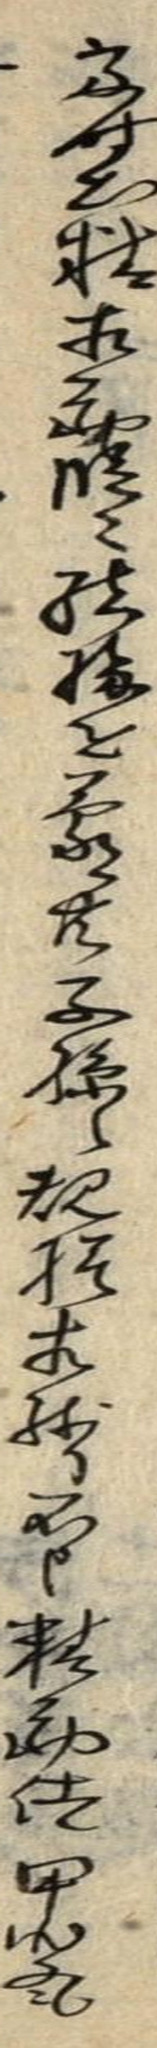当時出精相勤段々結構を蒙候共子孫之規摸相残り不申精勤仕候甲斐も
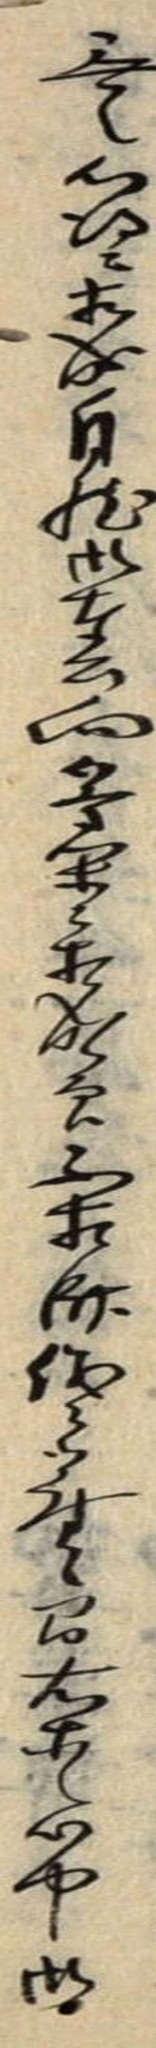無之心得に相成自然御奉公向等閑に相成候而は不相済儀に御座候間右等之心中御

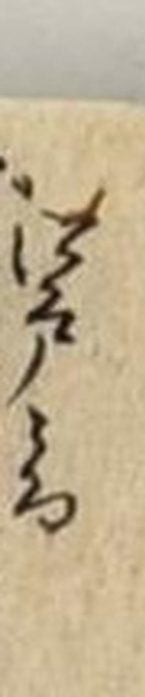江戸に而
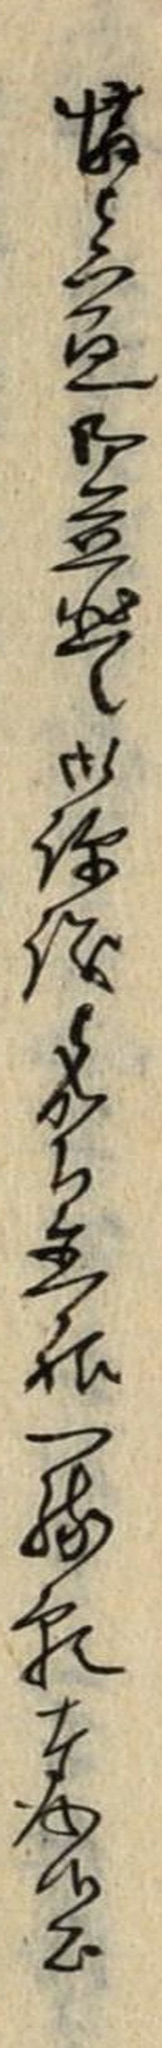憐被下置御慈悲之御評議被成下置候様一統願奉存候以上
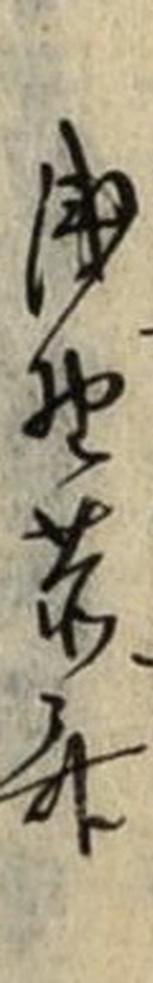浅野恭斎
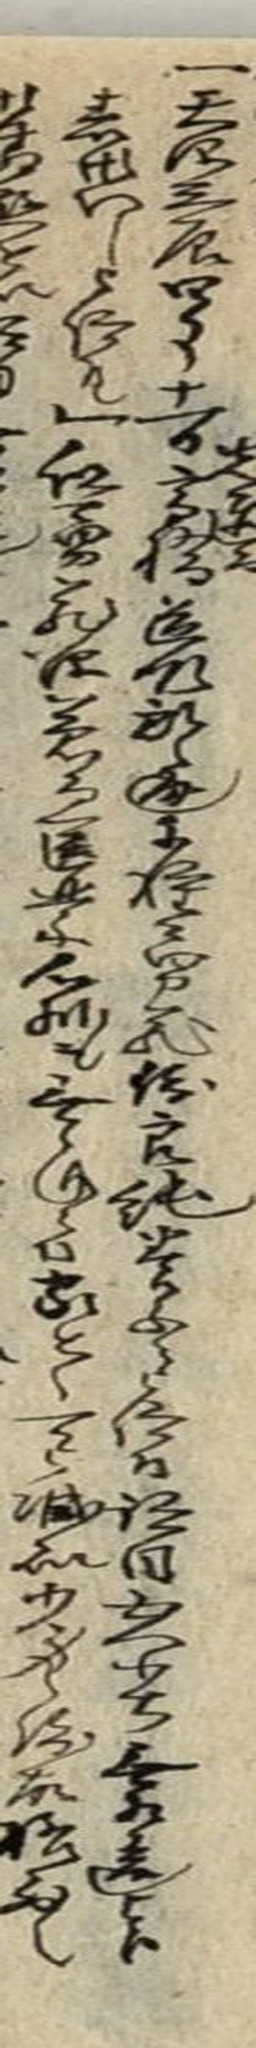表御いし被仰付候」但勇蔵儀兼而医業心掛も無之趣に付家とく可被減候処少身之儀故格別之
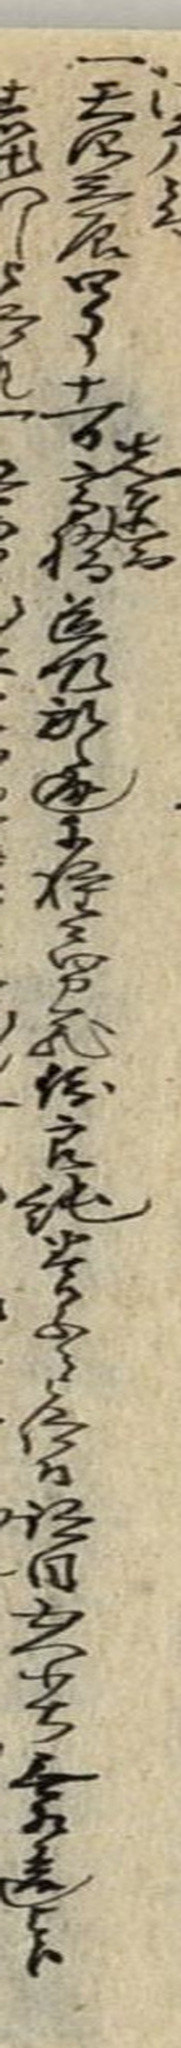一天保三辰四月十一日先達而高橋道順願之通千種勇蔵儀良純養子に被仰付跡目五人ふち無相違被下
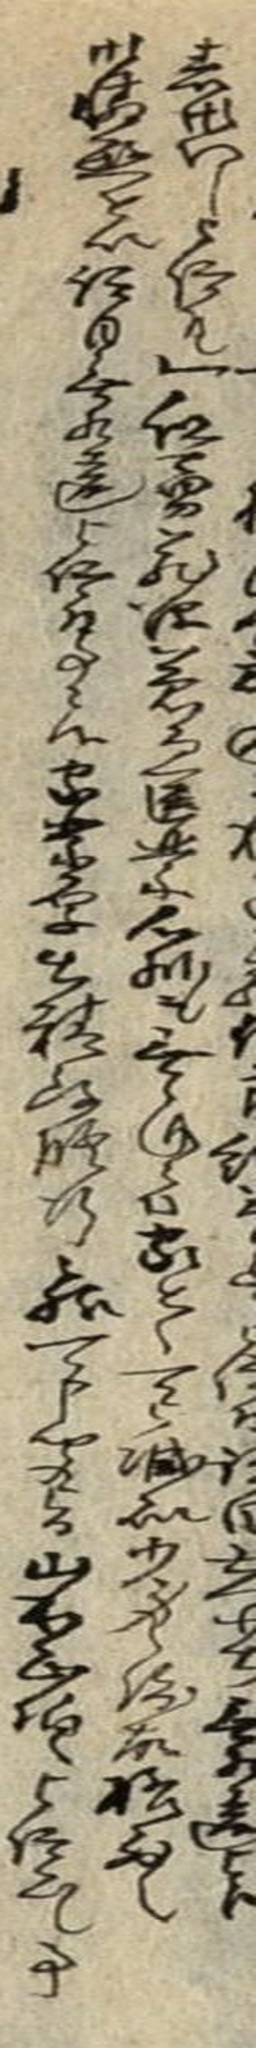御憐愍を以跡目無相違被仰付候事に候家業厚出精致修行候様可申聞旨山本正伯へ被仰出候事
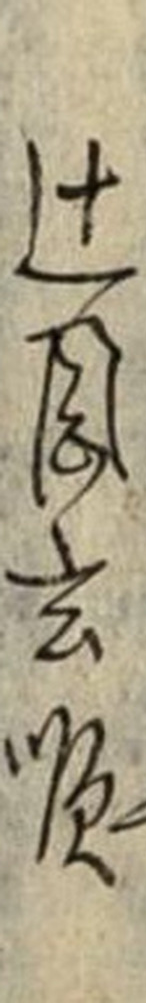辻岡玄順
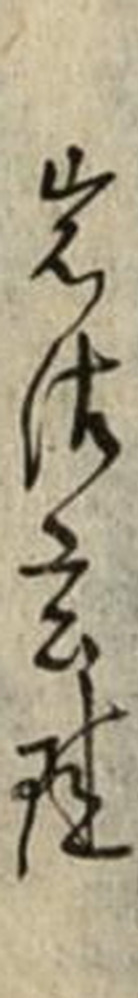岩佐玄珪
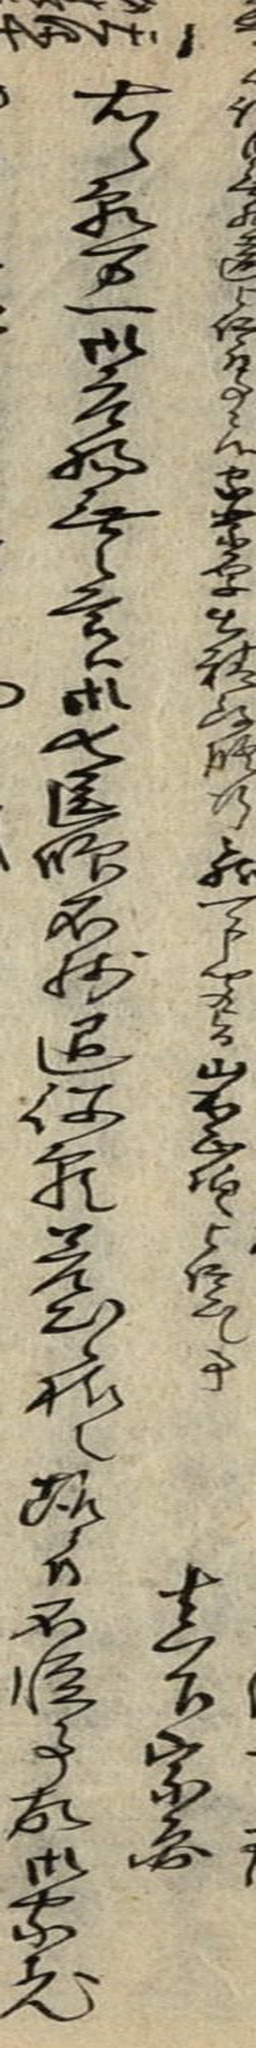右之願万一御取揚無之節は御匙医師不残退役願差出候様之趣に付不軽事故御家老
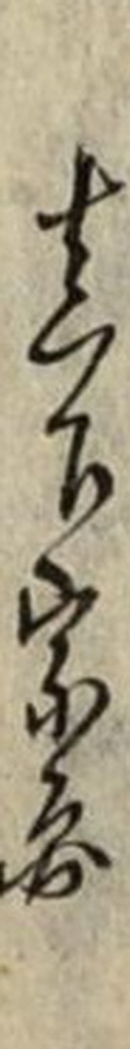真下宗円
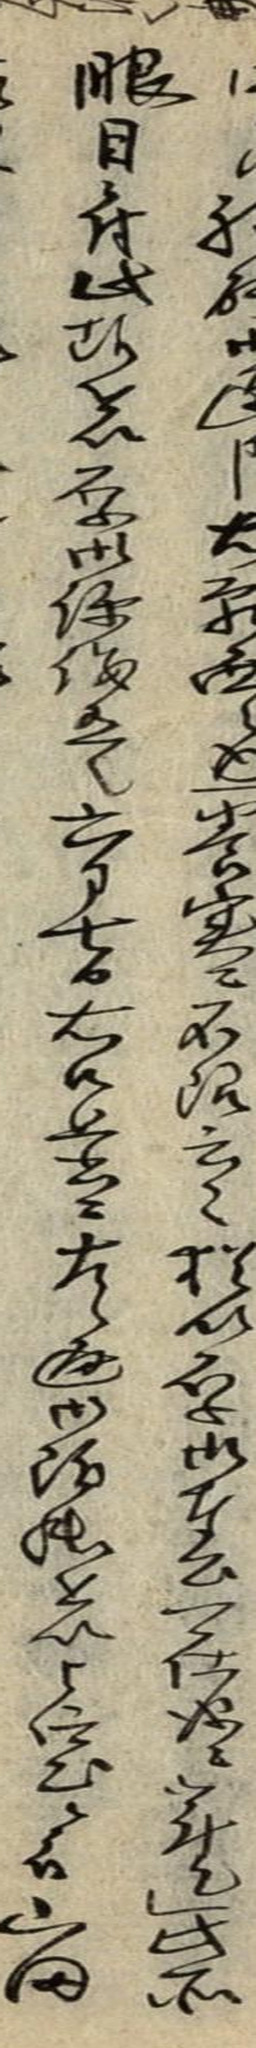眼目に付此趣を以厚御評議有之六月七日右口上書に左之通御附紙を以被仰出候に付山田
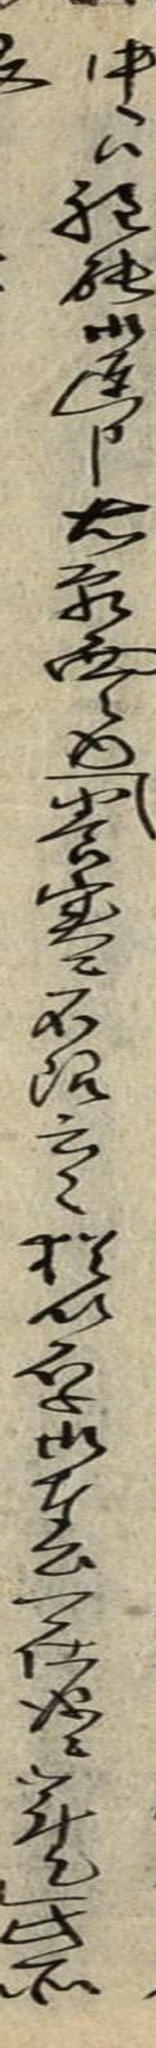中へは程能御達申右願面之内「養実に不限云々猶以厚御奉公可仕儀に御座候」此所
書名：御用并被仰出之部
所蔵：福井県文書館 Fukui Prefectural Archives
